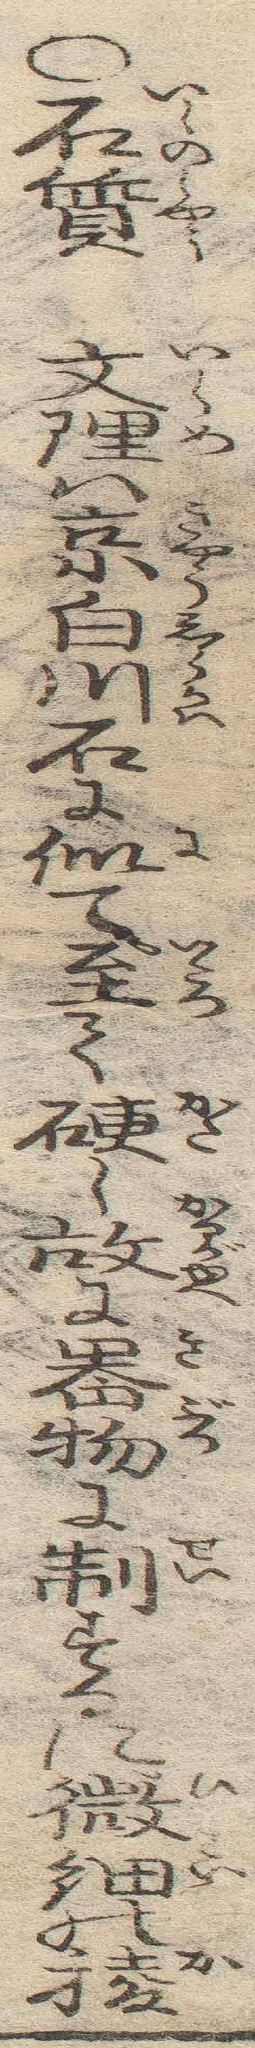○石質文理は京白川石に似て。至て硬し故に器物に制するに微細の稜
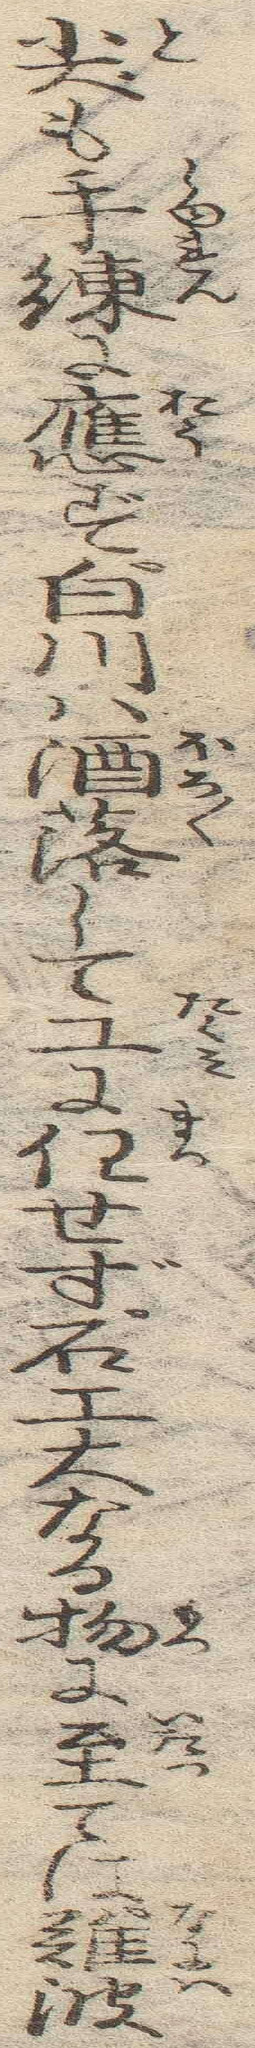尖も手練に応ず。白川は酒落して工に任せず。石工大なる物に至ては。難波
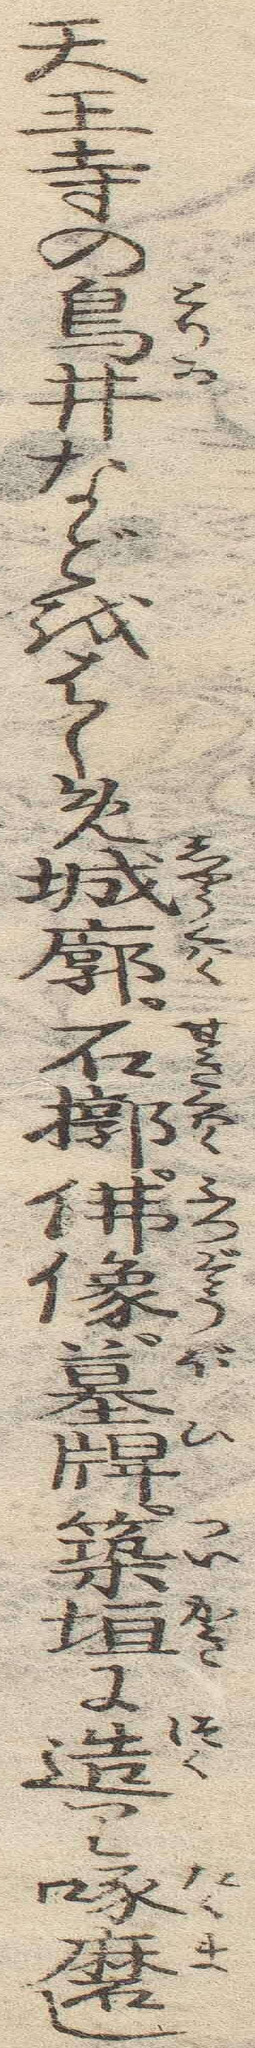天王寺の鳥井などをはしめ城廓。石槨。仏像。墓牌。築垣に造り啄磨し
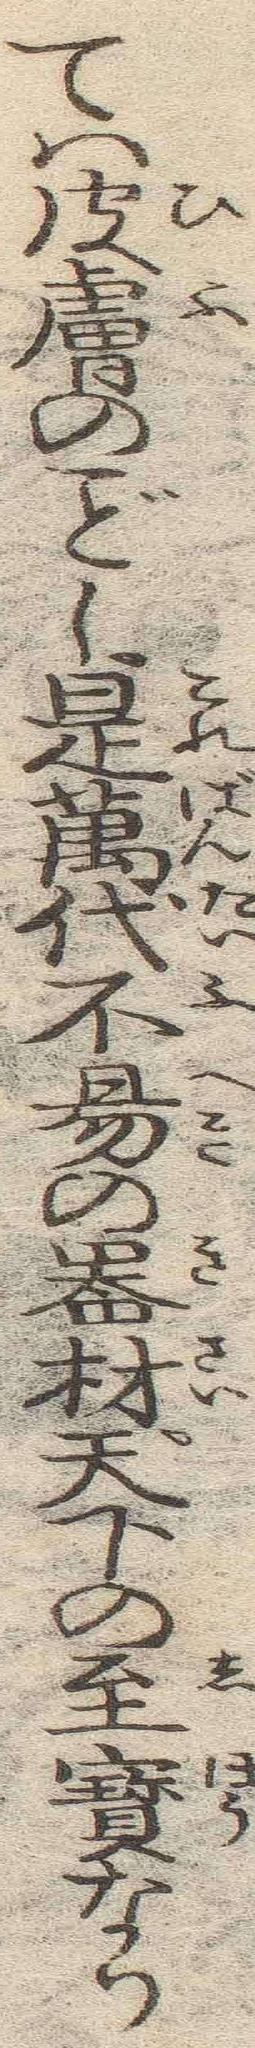ては皮膚のごとし。是万代不易の器材。天下の至宝なり
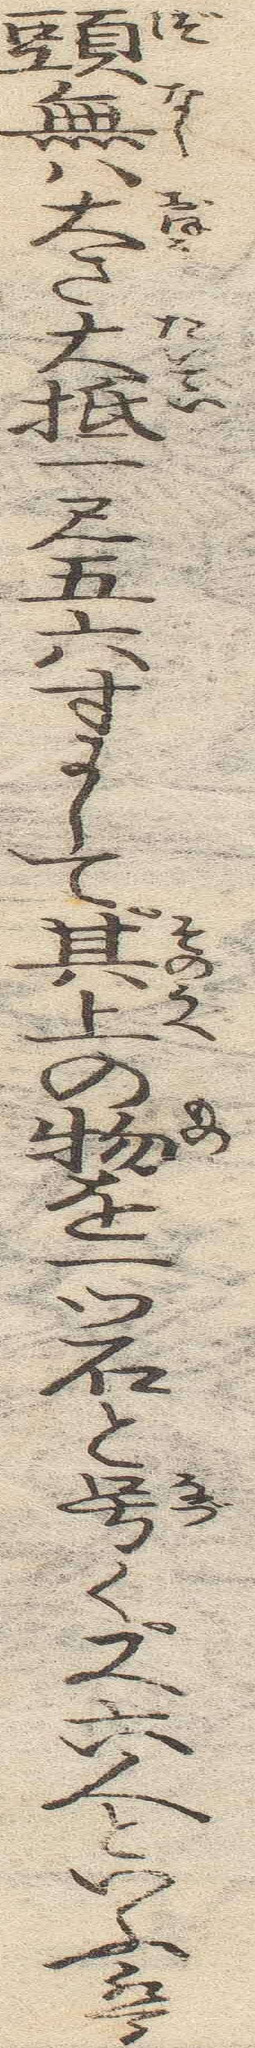頭無は大さ大抵一尺五六寸にして。其上の物を一ツ石と号く。又六人といふは
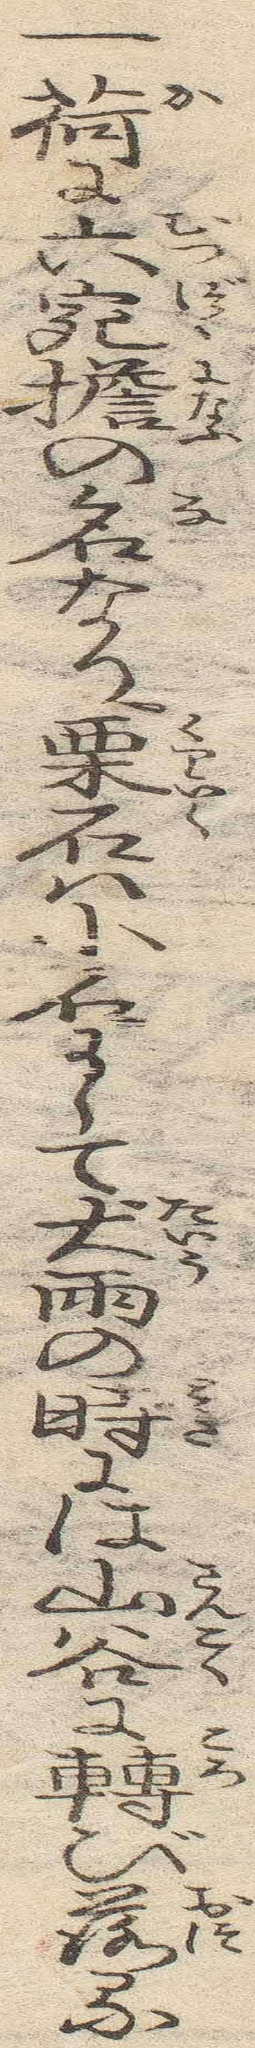一荷に六宛担の名なり。栗石は小石にして。大雨の時には山谷に転び落る
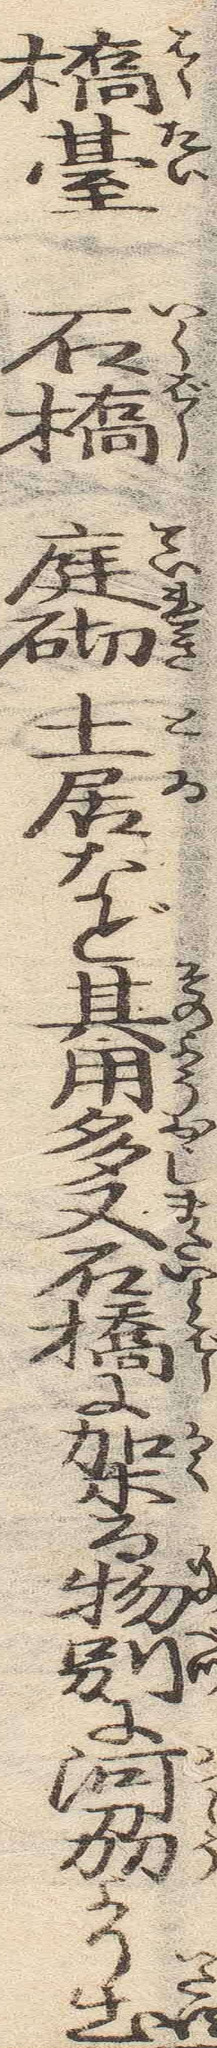橋台石橋庭砌土居など其用多又石橋に架る物別に河州より出
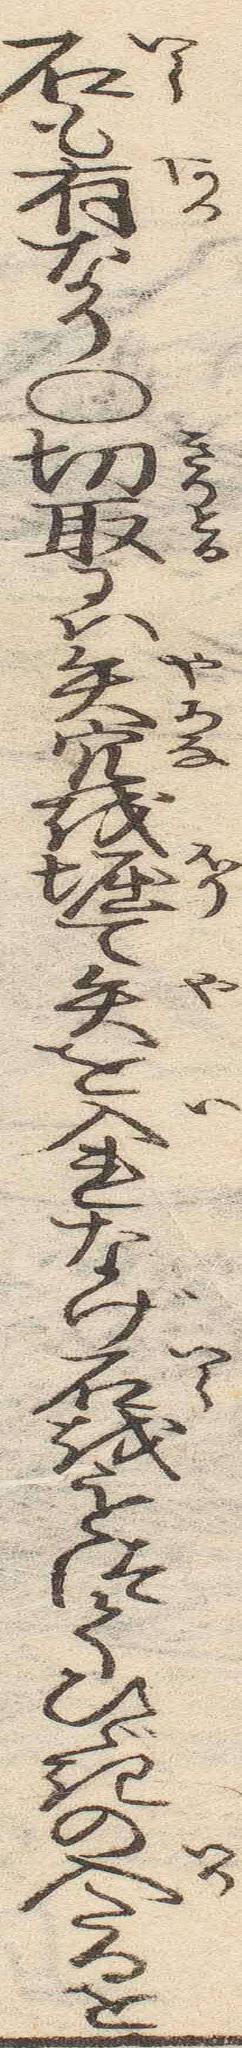石も有なり○切取には矢穴を堀て矢を入れなげ石をもつてひゞきの入たるを
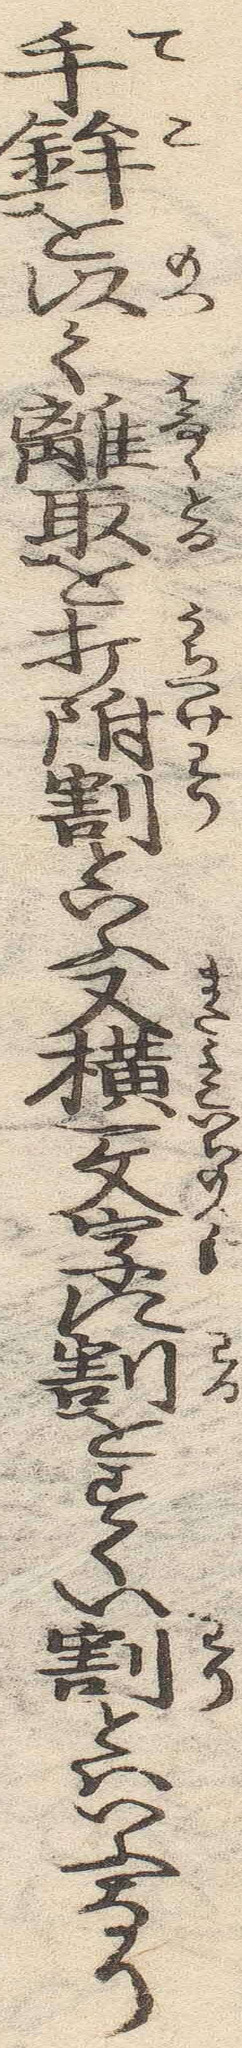手鉾を以て離取を打附割といふ又横一文字に割をすくい割とはいふなり
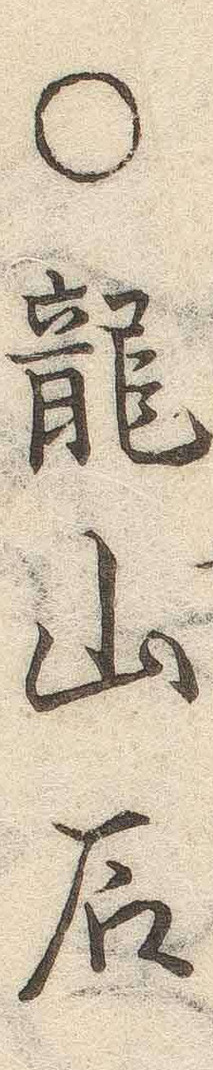○龍山石
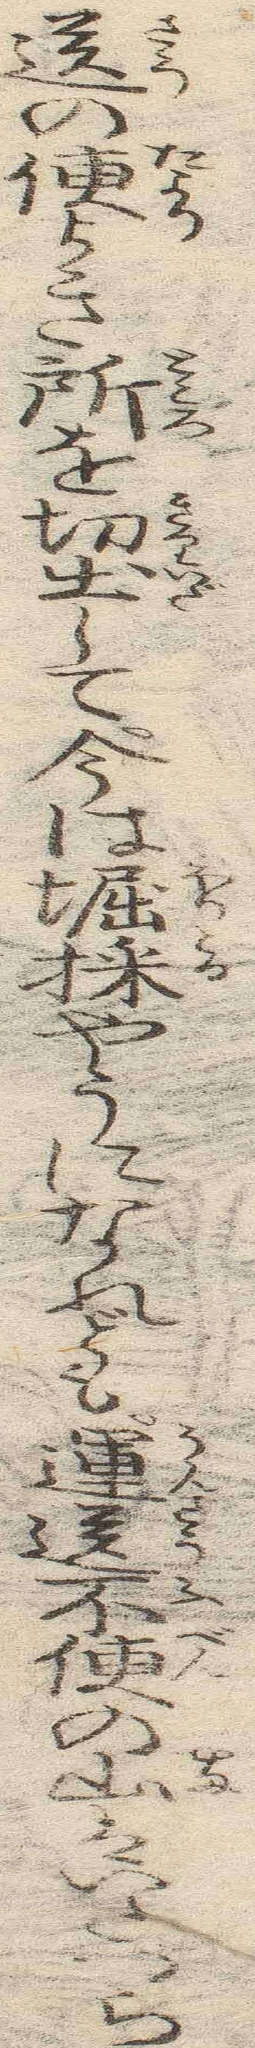送の便よき所を切出して。今は掘採やうになれども。運送不便の山はいたづら
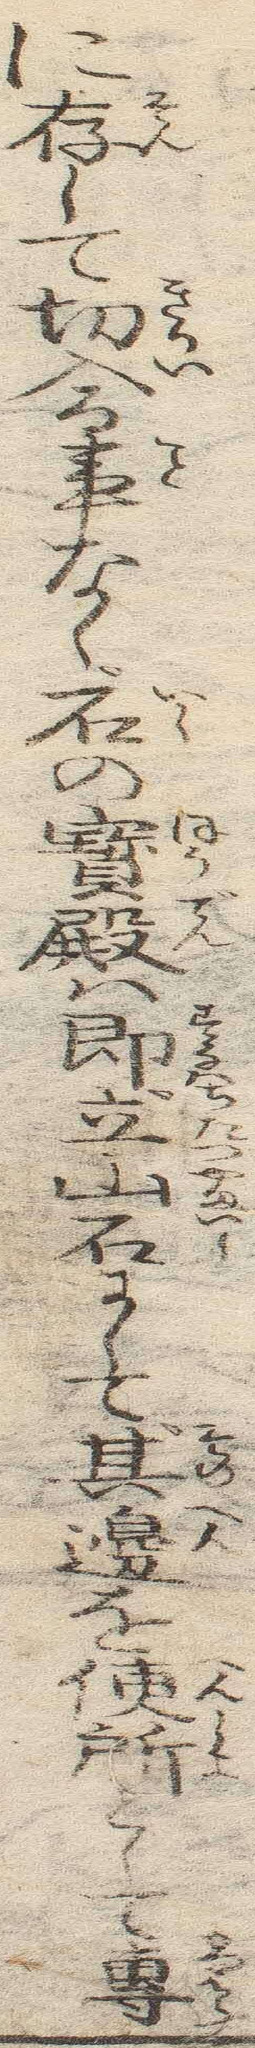に存して切入る事なし。石の宝殿は即。立山石にして。其辺を便所として専
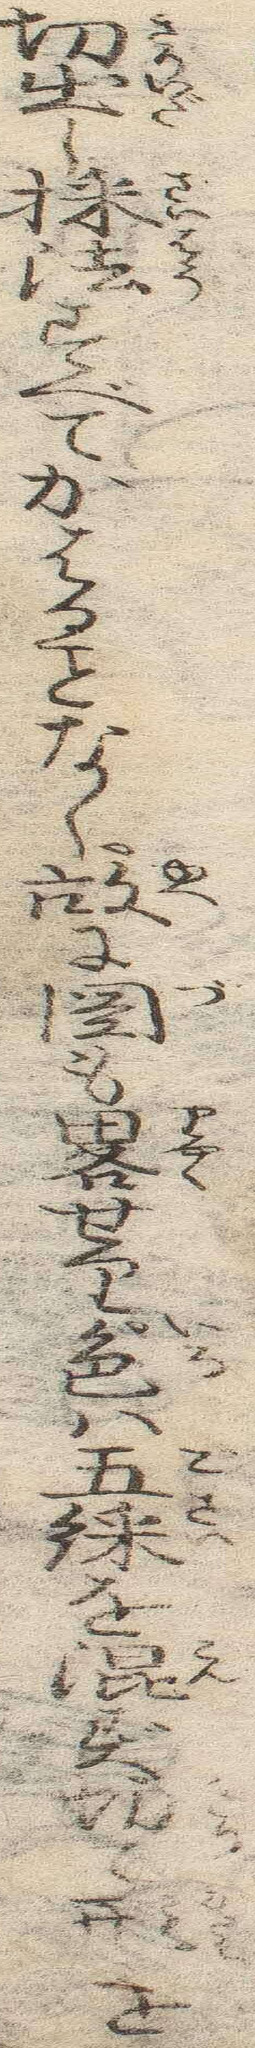切出し採法すべてかはることなし。故に図も略せり。色は五綵を混ず。切て形を
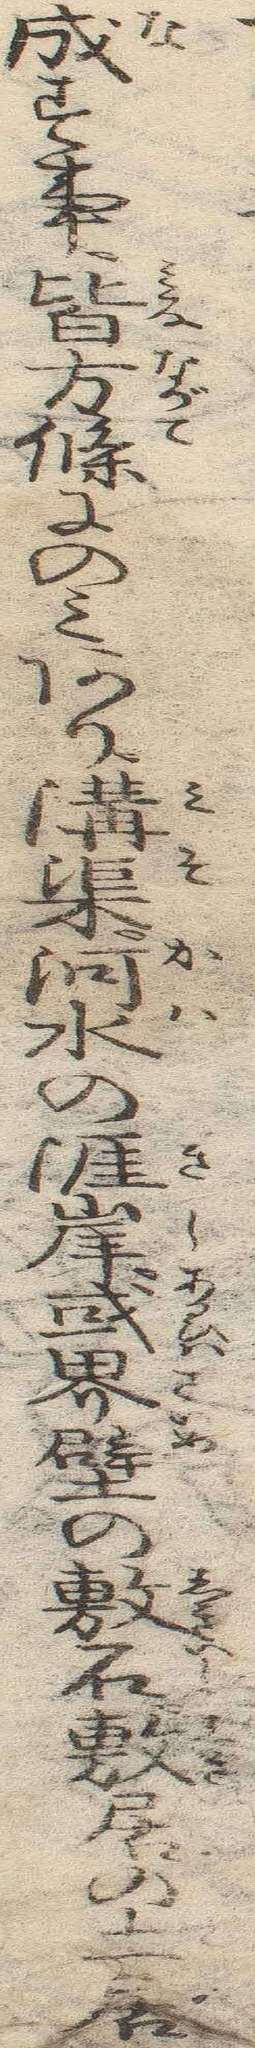成す事。皆方條にのみあり。溝渠。河水の涯岸。或界壁の敷石。敷居の土居
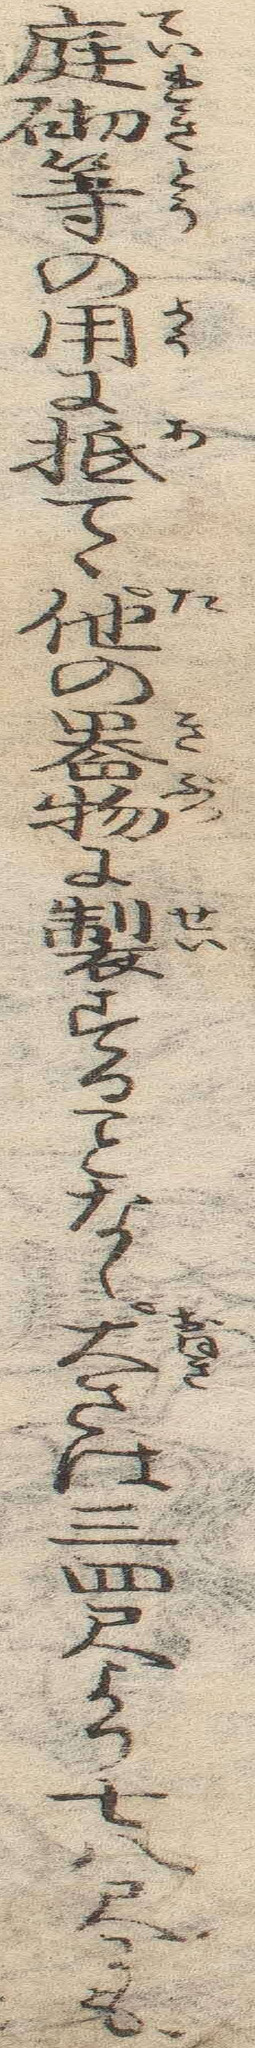庭砌等の用に抵てゝ。他の器物に製することなし。大さは三四尺より七八尺にも
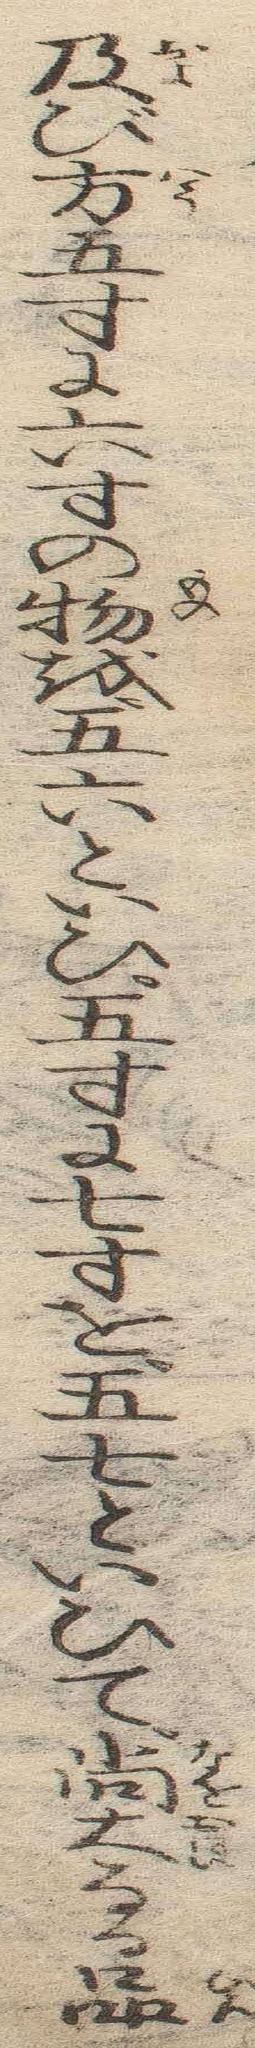及び方五寸に六寸の物を。五六といひ。五寸に七寸を。五七といひて。尚大なる品
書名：日本山海名産図会
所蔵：東京学芸大学附属図書館 国文学研究資料館
